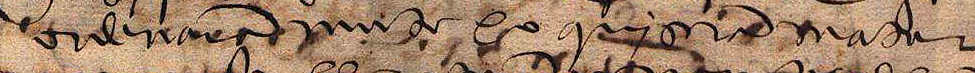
ordenarā muto e ho qujserā matar
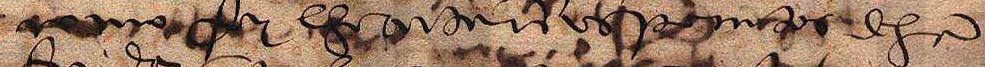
como foy lhe cortarē os pomtos de huā
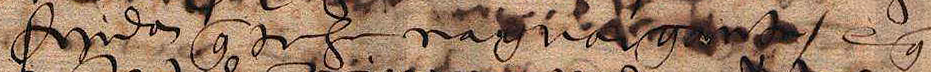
ferida q̄ tinha na guarganta / e q̄
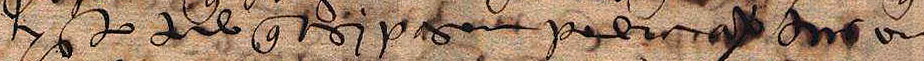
ysto tudo q̄ asy pasou podera aꝟ tres ou
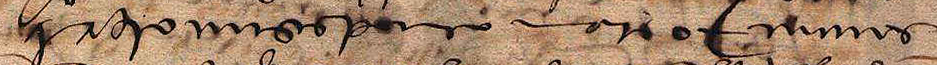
quatro meses pouco mais ou menos
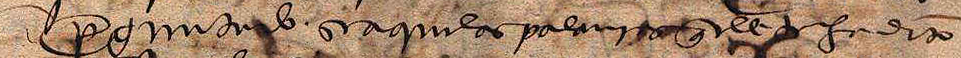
item p̄gumtado se aquelas palauras q̄ elle tinha dito
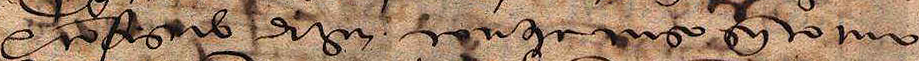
e cōfesado dizer contra noso s̄r como
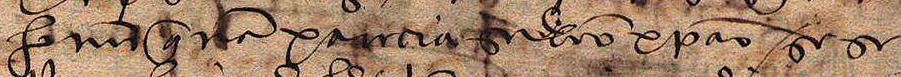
homē q̄ nā pareçia ser de boō xpão / se se
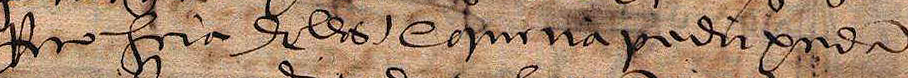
Reconheçia dellas e queria pedir perdā
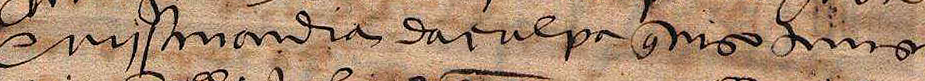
e mjsericordia da culpa q̄ niso teuese
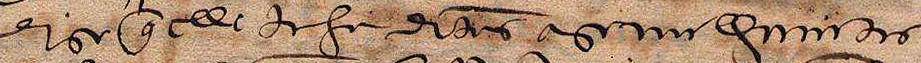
dise q̄ elle tinha ditas a semelhamtes
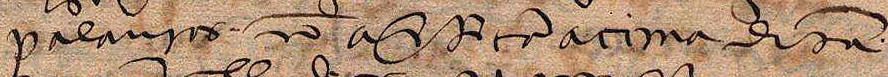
palauras c̄o a ētēçā acima dita
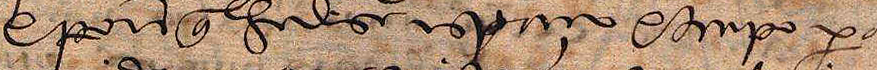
e porē q̄ lhe dese espaço e tenpo ꝑa
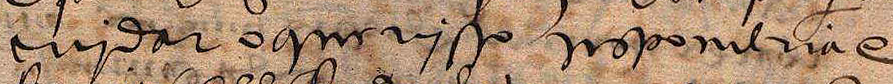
cujdar o que njsso responderia e
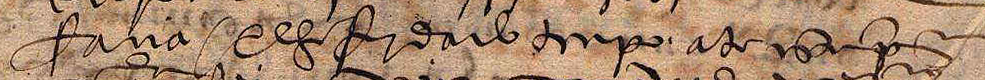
faria / e lhe foj dado tenpo ate esta p̄ma
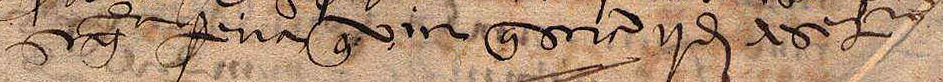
segda feira q̄ vier q̄ serā ij dj de setro
